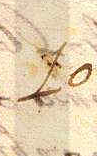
10.
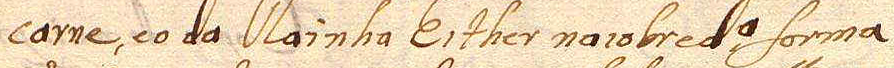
carne, e o da Rainha Esther na sobred.a forma
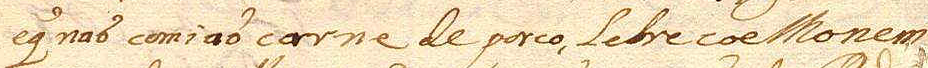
e q̄ naõ comiaõ carne de porco, Lebre coelho nem,
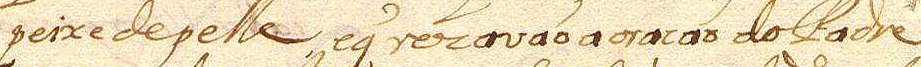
peixe de pelle, e q̄ rezavaõ a oraçaõ do Padre
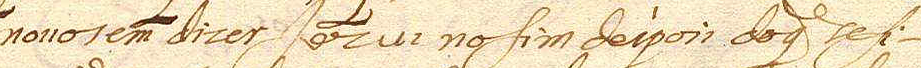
nosso sem dizer Jezus no fim despois do q̄ se fi
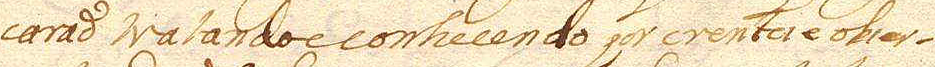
caraõ tratando e conhecendo por crentes e obser
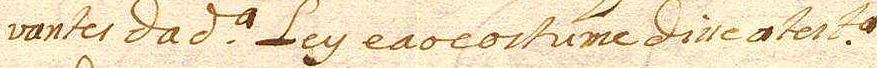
vantes da d.a Ley e ao costume disse a test.a
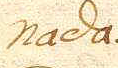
nada.
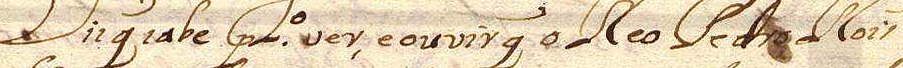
Dis q̄ sabe pL.o ver, e ouvir q̄ o Reo Pedro Rois̄
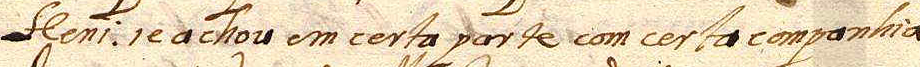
Hens̄ se achou em certa parte com certa companhia
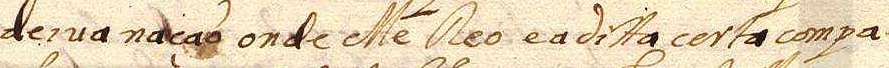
de sua naçaõ onde elle Reo e a ditta certa compa
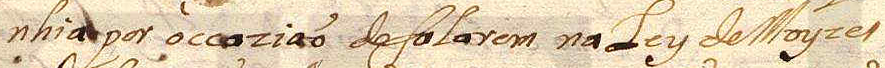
nhia por occaziaõ de falarem na Ley de Moyzes
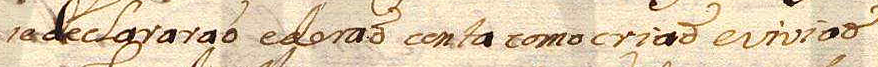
se decLararaõ e deraõ conta como criaõ e viviaõ
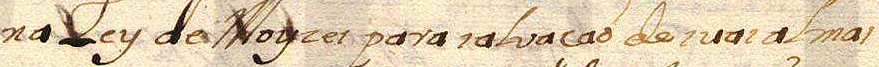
na Ley de Moyzes para salvaçaõ de suas almas
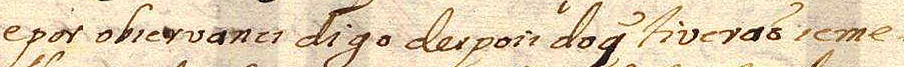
e por observanci digo despois do q̄ tiveraõ seme
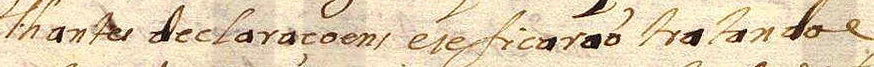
lhantes declaraçoens e se ficaraõ trantando e
